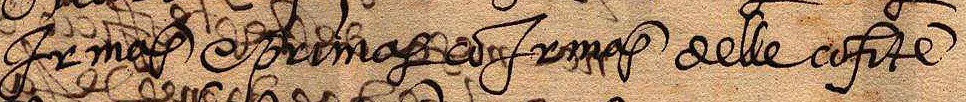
Jrmas̄ e primas cōJrmas̄ delle cōfitē
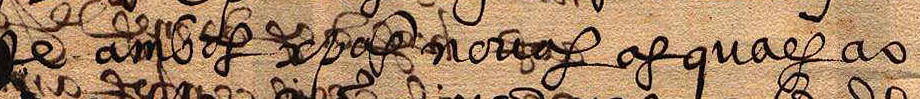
te ambos xpas̄ nouas as quaes ao
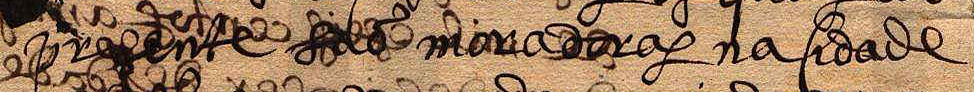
presente saõ moradoras na Cidade
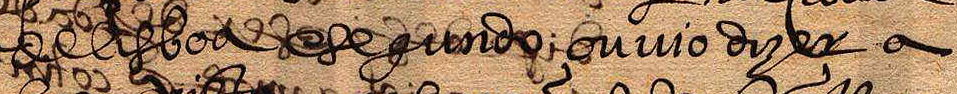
de lisboa e segundo ouuio dizer a
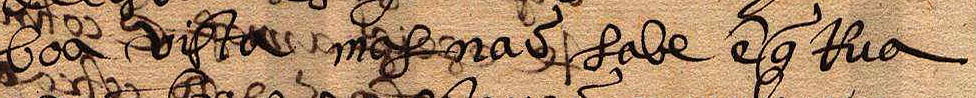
boavista mas naõ sabe ē q̄ Rua
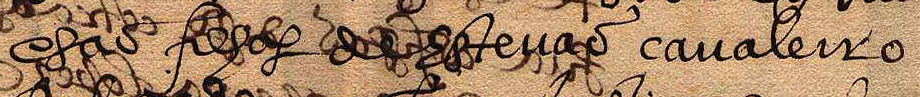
e saõ filhas de Esteuaõ caualeiro
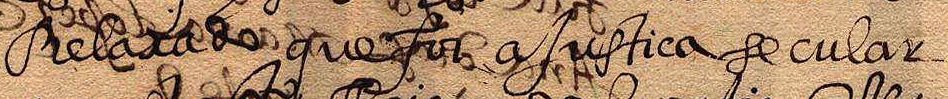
Relaxado que foi a Justiça secular
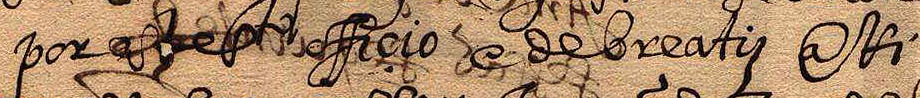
por este sto officio e de breatiz āRi
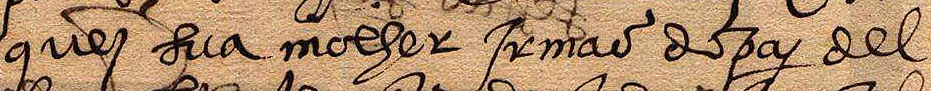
quez sua molher Jrmaõ do paj del
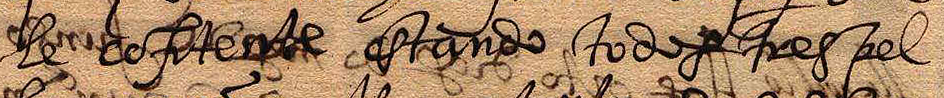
le cōfitente estando todos tres pel
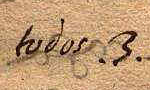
todos .3.
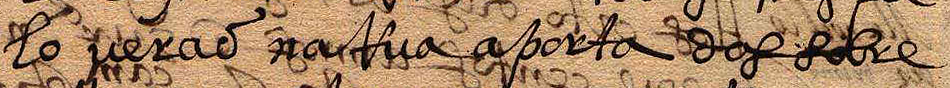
lo ueraõ na Rua a porta das sobre
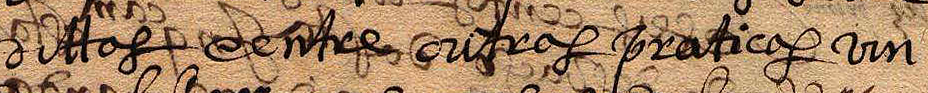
dittas e entre outras praticas vin
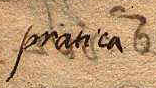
pratica
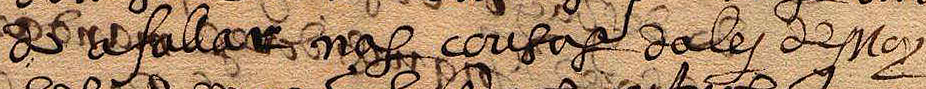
do a fallar nas cousas da lej de Moy
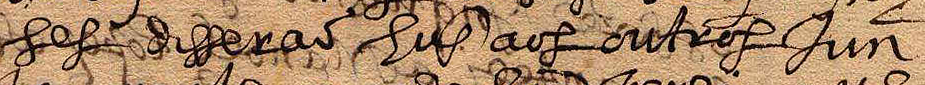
ses disseraõ hus̄ aos outros Jun
